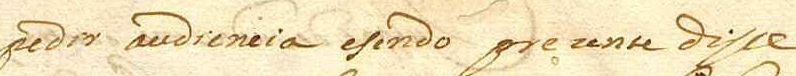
pedir audiencia e sendo prezente disse
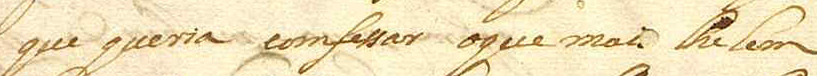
que queria comfessar o que mais lhe lem
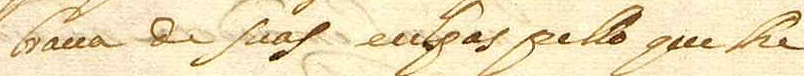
braua de suas culpas pello que lhe
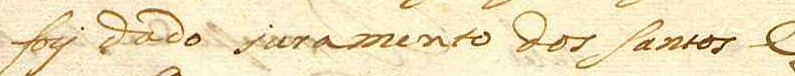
foy dado juramento dos santos E
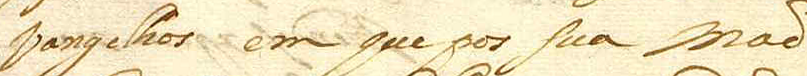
Vangelhos em que pos sua maõ
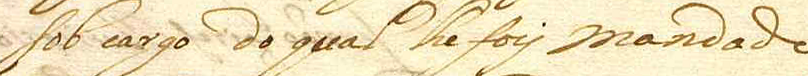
sob cargo do qual lhe foy mandado
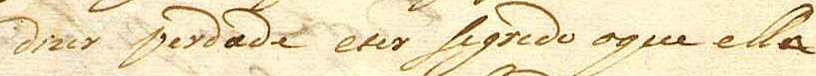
dizer Verdade e ter segredo o que ella
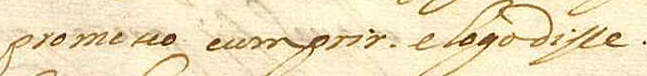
prometeo cumprir. e logo disse.
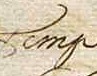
Temp
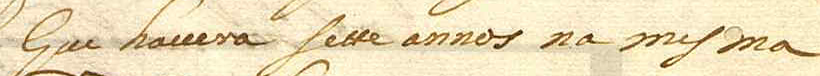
Que havera sette annos na mesma
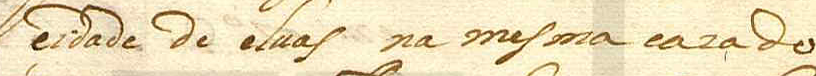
cidade de eluas na mesma caza do
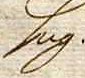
Lug.
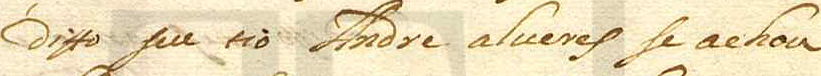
ditto seu tio Andre alueres se achou
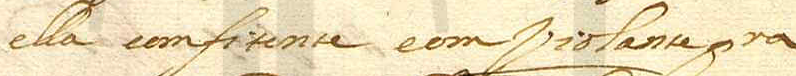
ella comfitente com Violante pra
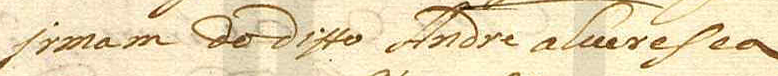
jrmam do ditto Andre alueres ca
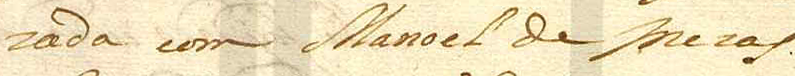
zada com Manoel de Mezas
